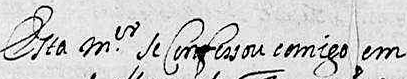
Esta m.er se Confessou comigo em
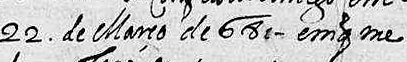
22. de Março de 681 - em q̄ me
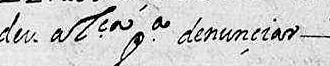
deu a L.ca p.a denunciar
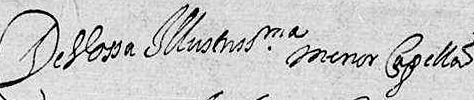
De Vossa Illustriss.ma menor Capellaõ
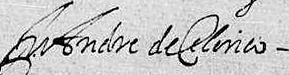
fr Andre de Celorico
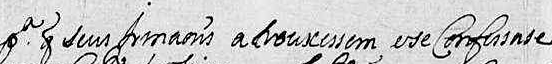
pa q̄ seus Irmaõns a trouxessem, e se Confessase
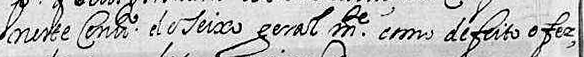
neste Conuto. de seixo geralmte. como de feito o fez,
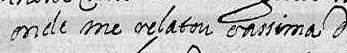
onde me relatou o assima d.
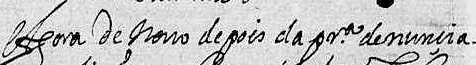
Agora de nouo depois da pr.a denuncia
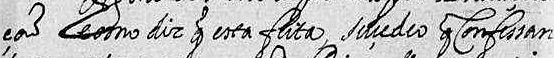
çaõ como diz q̄ esta feita, sucedeo q̄ Confessan
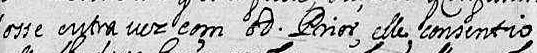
dosse outra uez com o d. Prior, elle consentio
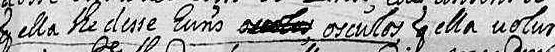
q̄ ella lhe desse hun̄s occolos, osculos, q̄ ella uolun
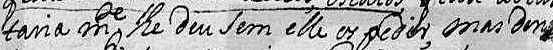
tariamte lhe deu sem elle os pedir, mas don
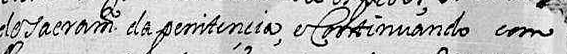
do sacramto da penitencia, e Continuando com
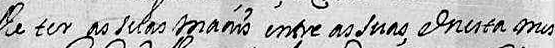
lhe ter as suas maons̄ entre as suas, e nesta mes
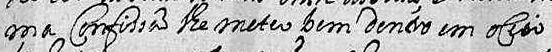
ma Confissaõ lhe meteo bem dentro em o Ceio
